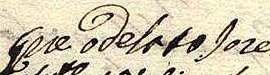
que o delato Joze
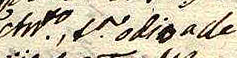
An.to, t.a odio a cle
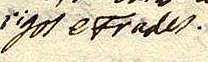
rigos e Frades.
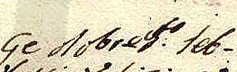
qe o sobred.to seb
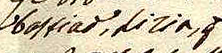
astiaõ, dizia, q̄
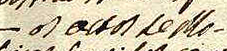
- os actos de Mo
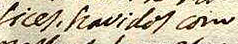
lices, havidos com
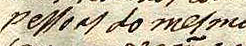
pessoas do mesmo
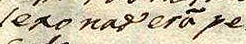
sexo naõ erā pe
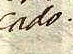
cado.
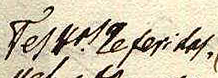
Test.as Referidas,
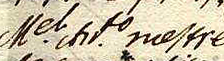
M.el Ant.o mestre
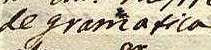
de gramatica,
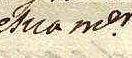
e sua m.er
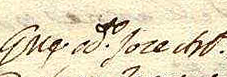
Que o d.to Joze Ant.o,
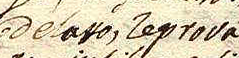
delatto, Reprová
